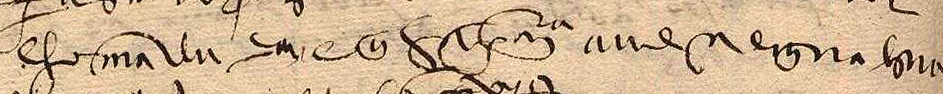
lho mādou ca e q̄ he ma audja degua de seu
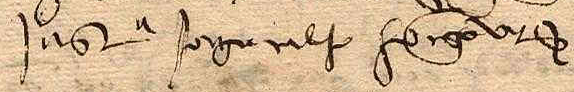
Justa Jorge coelho ho esp̄vy
